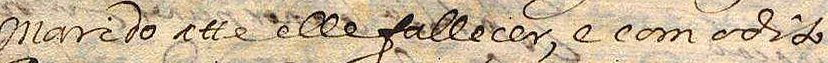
marido atte elle fallecer, e com o dito
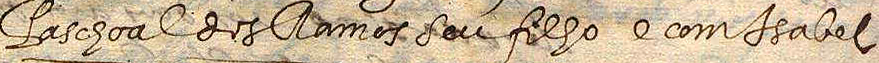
Paschoal dos Ramos seu filho e com Isabel
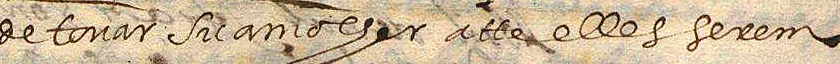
de touar sua molher atte elles serem
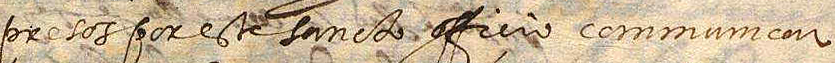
presos por este sancto officio communicou
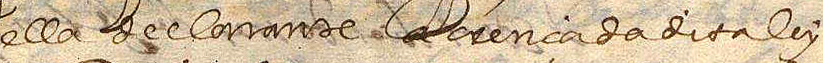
ella declarante a crença da dita ley
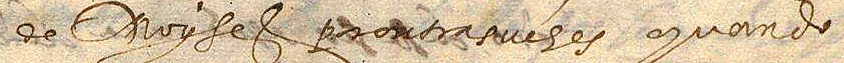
de Moyses por outras uezes quando
